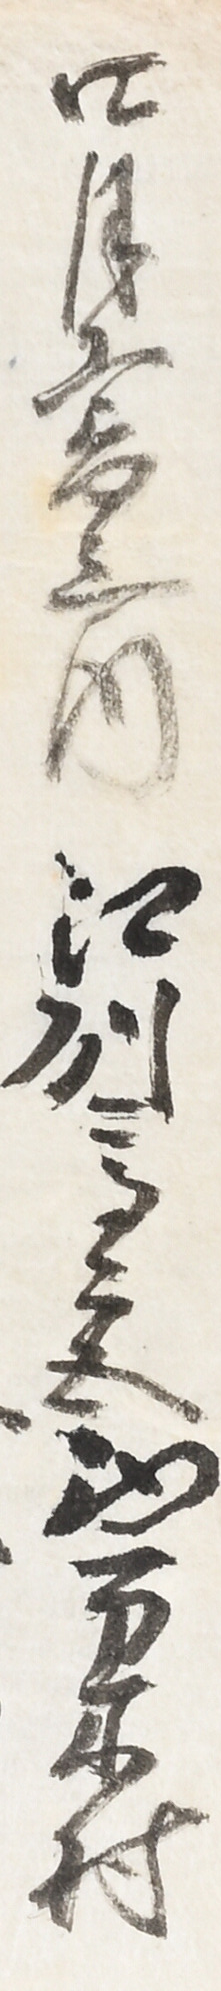四月書上内江州高宮西万木村
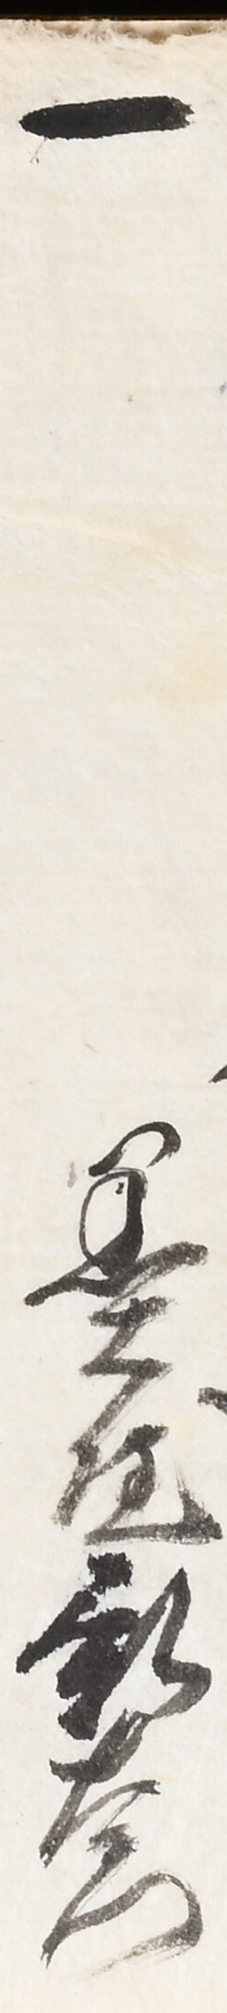一墨屋新右衛門
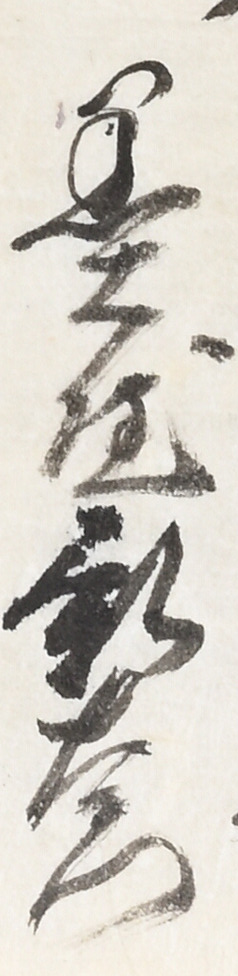一墨屋新右衛門
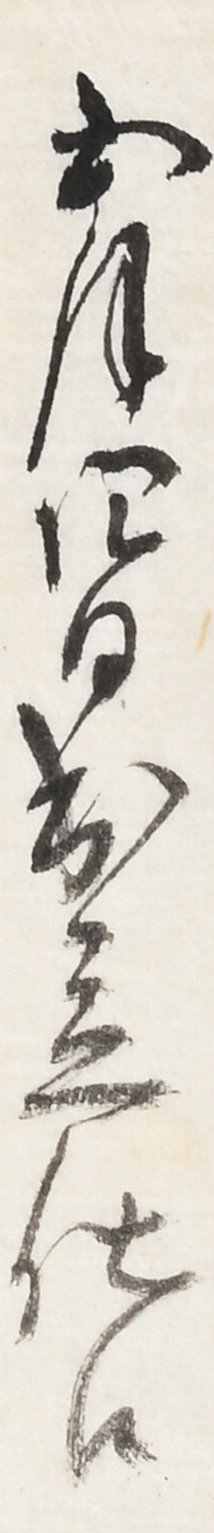五月四日出立仕候
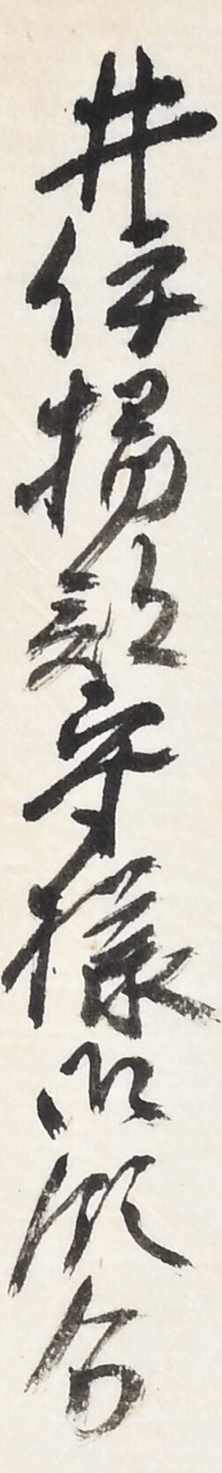井伊掃部守様御領分
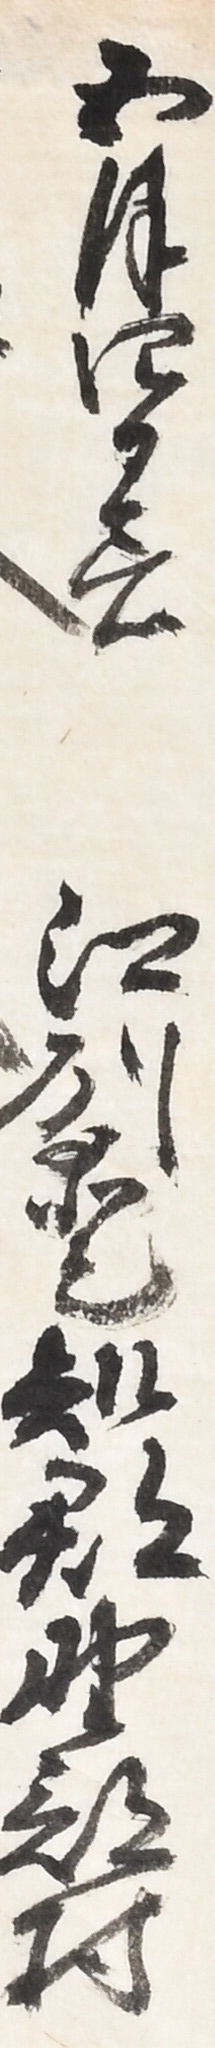五月四日着江州愛知郡野部村
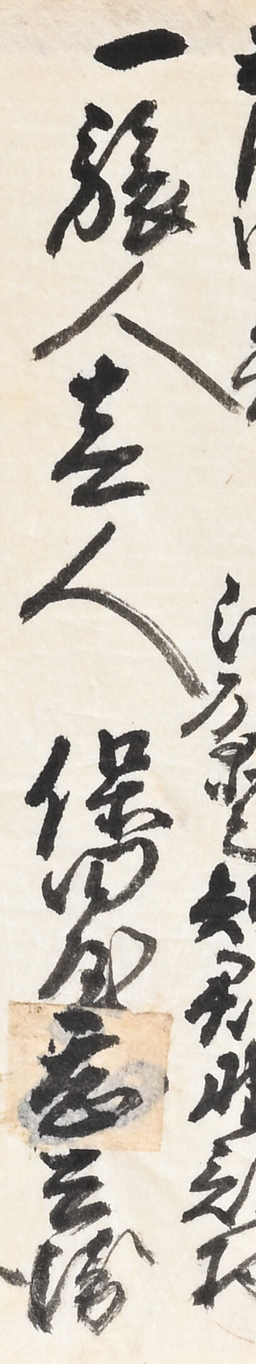一旅人壱人保田屋甚兵衛
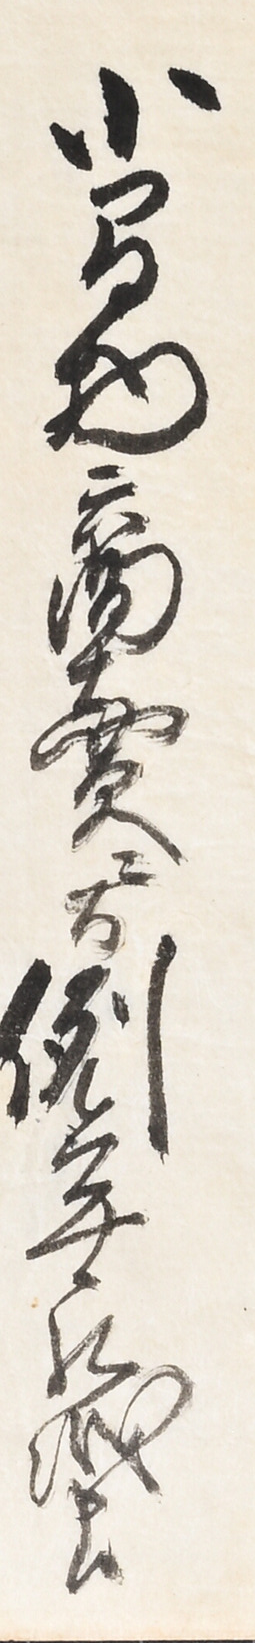小間物商売ニ而例年罷越申候
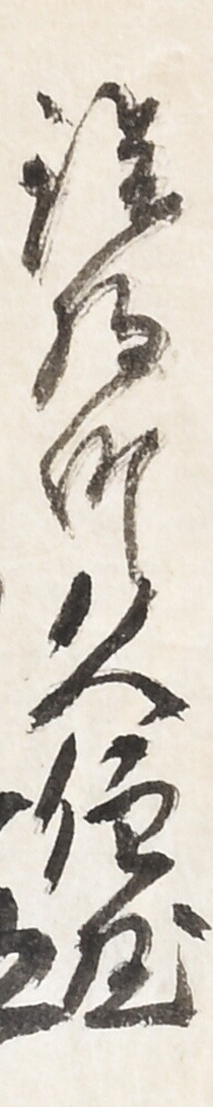鉾持町久住屋
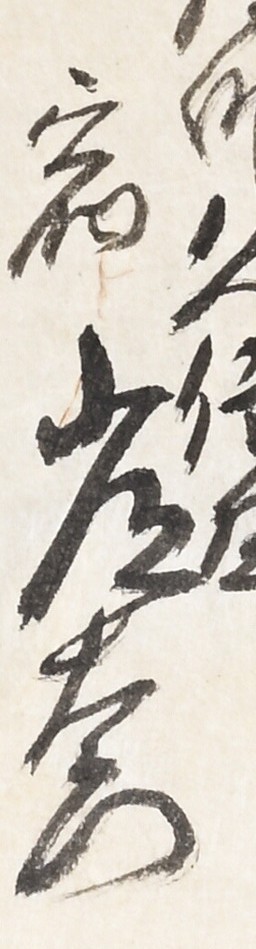宿常右衛門
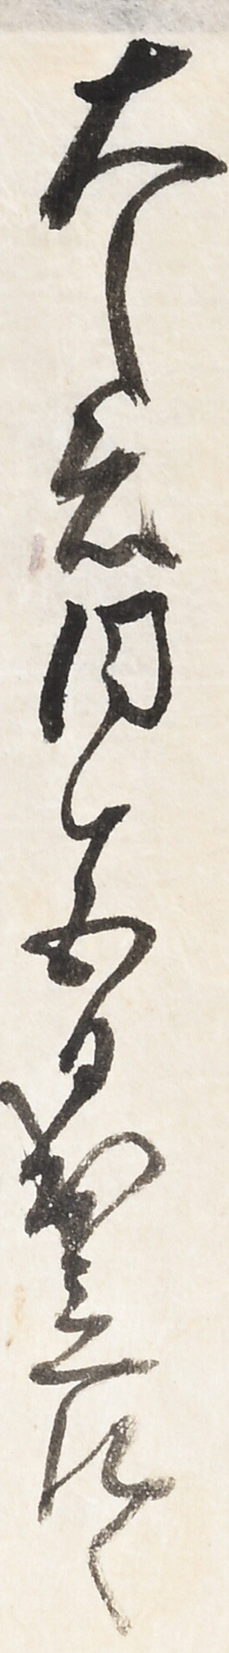右之者同十五日出立仕候
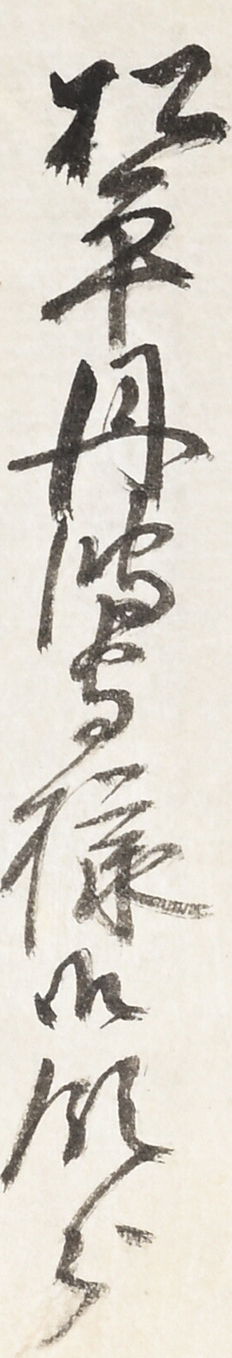松平丹波守様御領分
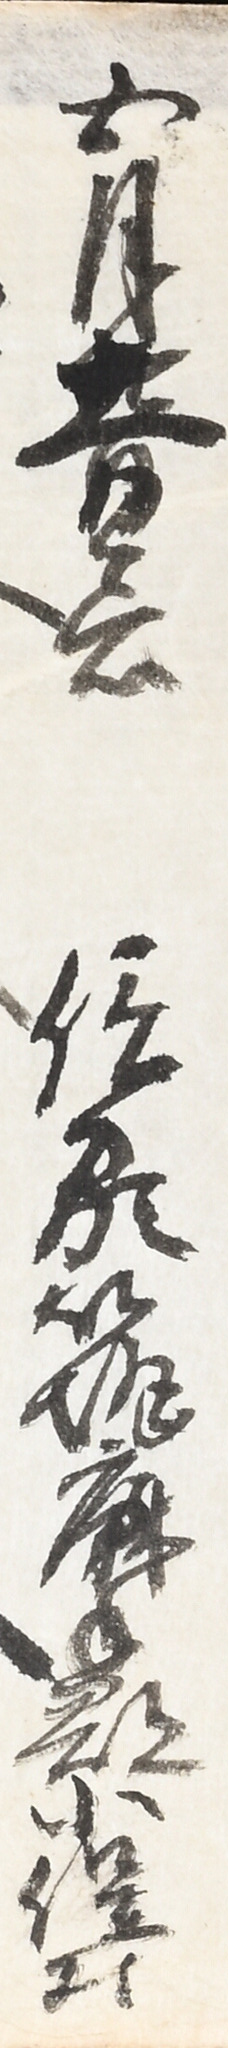五月十一日着信州筑摩郡小俣村
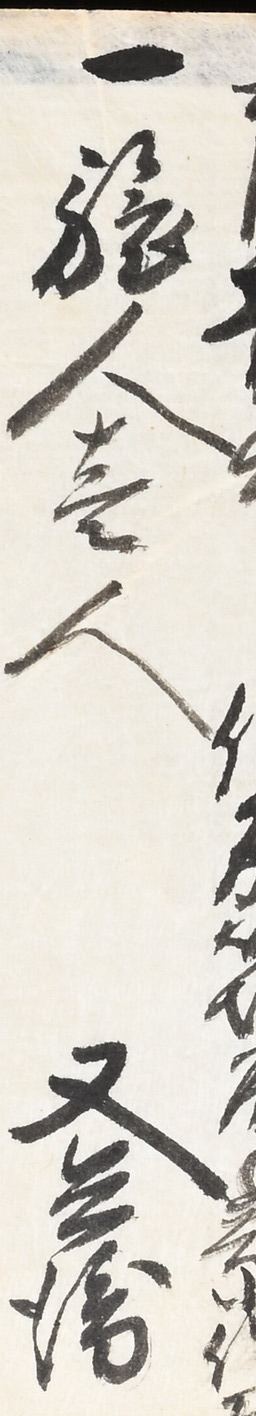一旅人壱人又兵衛
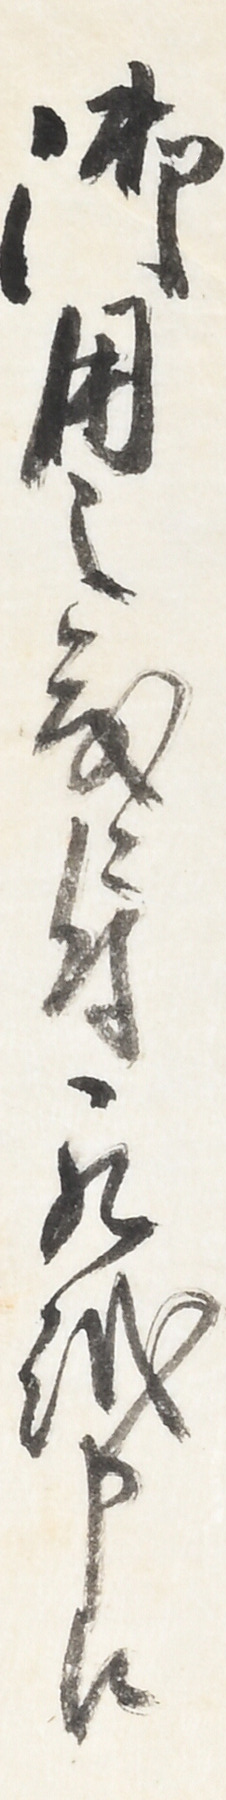御用之義ニ付罷越申候
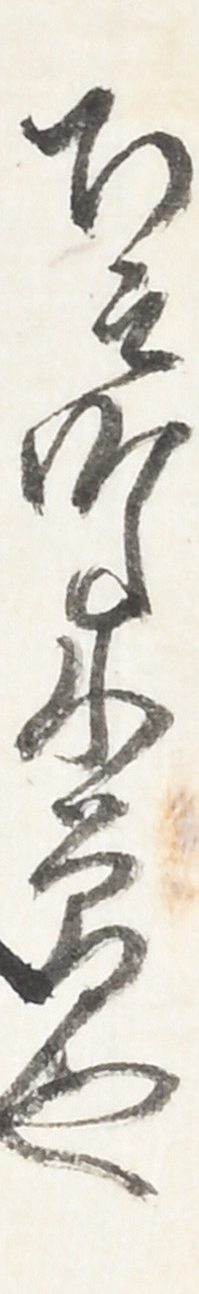下モ町木曽や
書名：旅人泊控帳
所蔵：伊那市立高遠町図書館・合同会社AMANE
